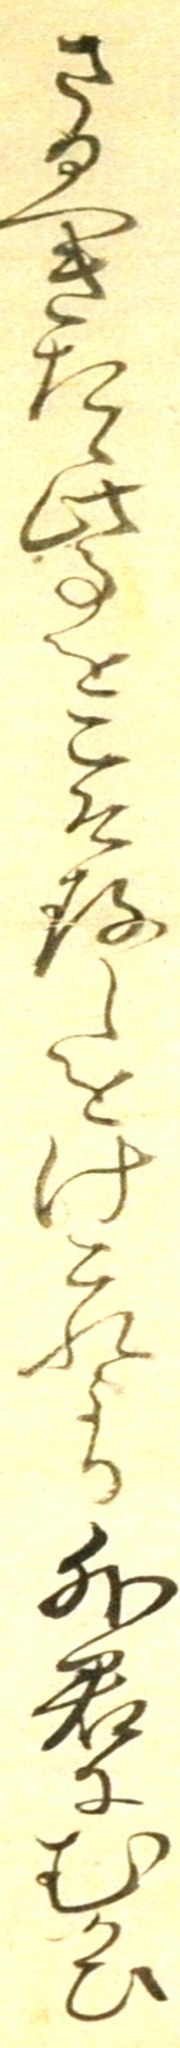さるへきたゝ此事をこそ致しをけこれより外君にむかひ
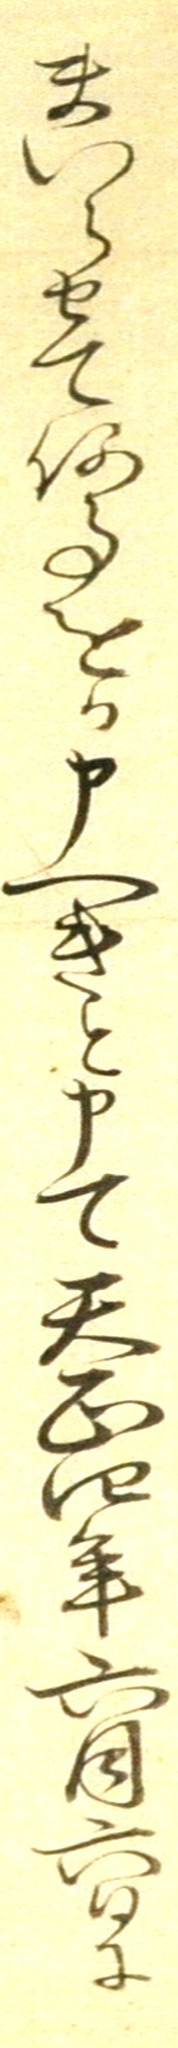まいらせて何事をか申へきと申て天正四年六月六日に

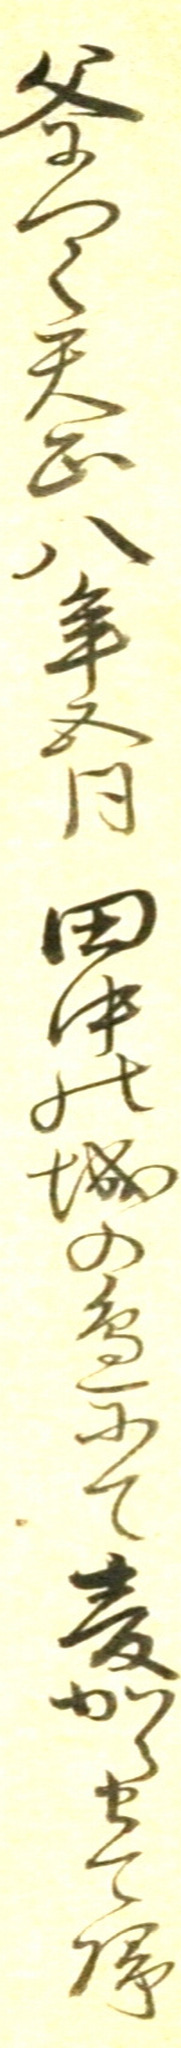父につく天正八年五月田中の城の辺にて麦からせて帰
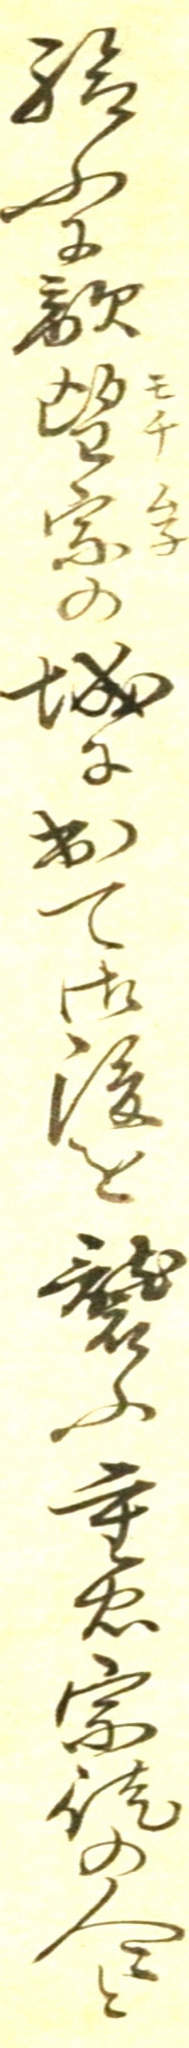給ふに敵望宗の城に出て御後を襲ふ重忠宗徒の人々と
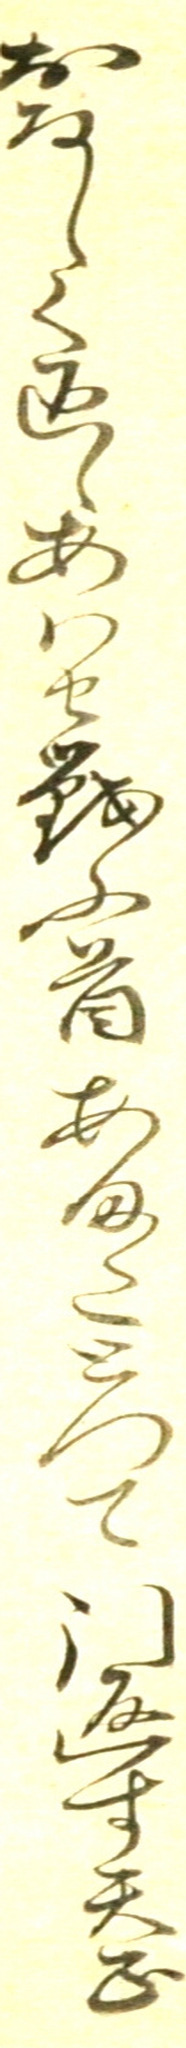おなしく返しあはせ戦ふ首あまたとつて引返す天正
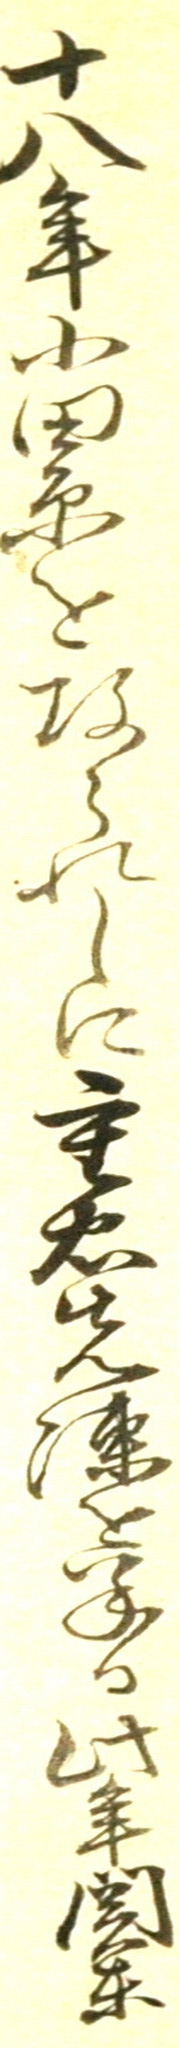十八年小田原を攻られしに重忠先陣を承る此年関東
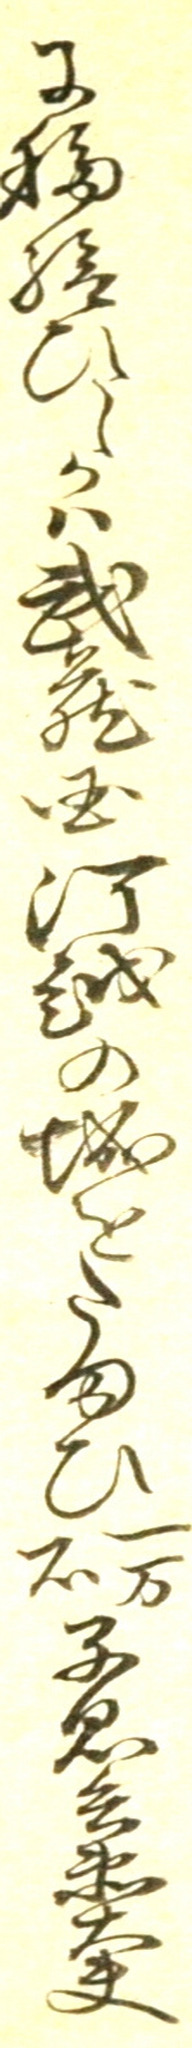に移給ひしかは武蔵国河越の城をたまひ一万石子息兵衛大夫
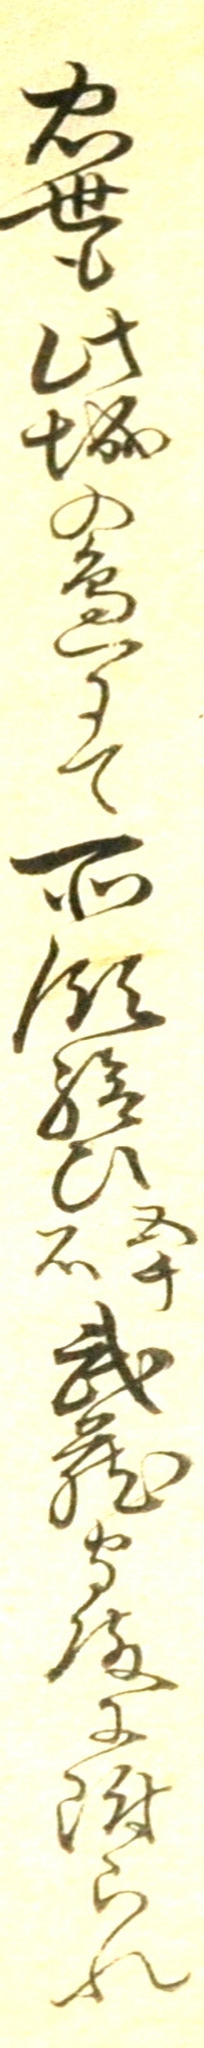忠世も此城の辺にて所領給ひ五千石武蔵守殿に付られ

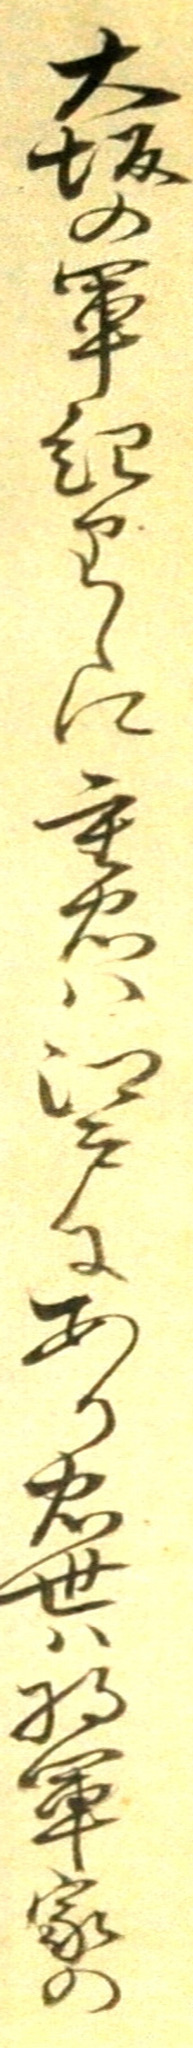大坂の軍起りしに重忠は江戸にあり忠世は将軍家の
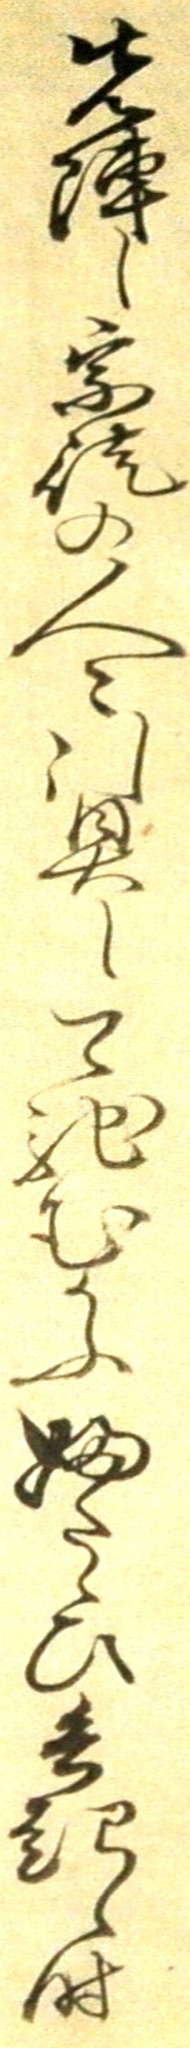先陣し宗徒の人々引具して馳むかふふたゝひ兵起し時
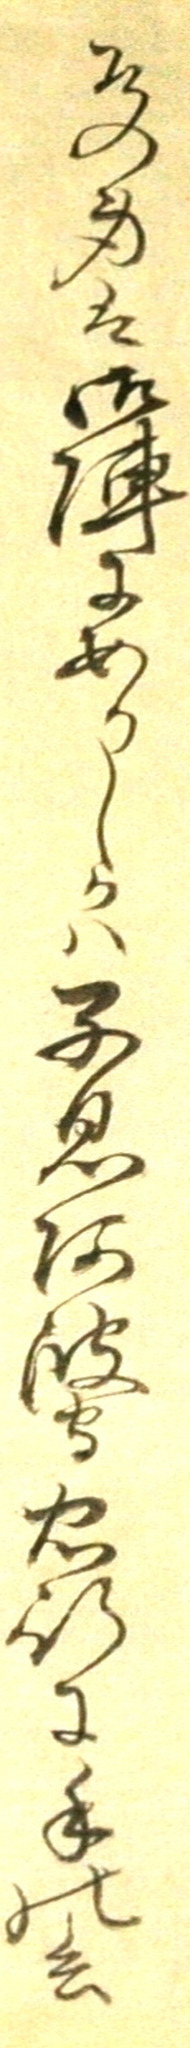その身は御陣にありしかは子息阿波守忠行に手の兵
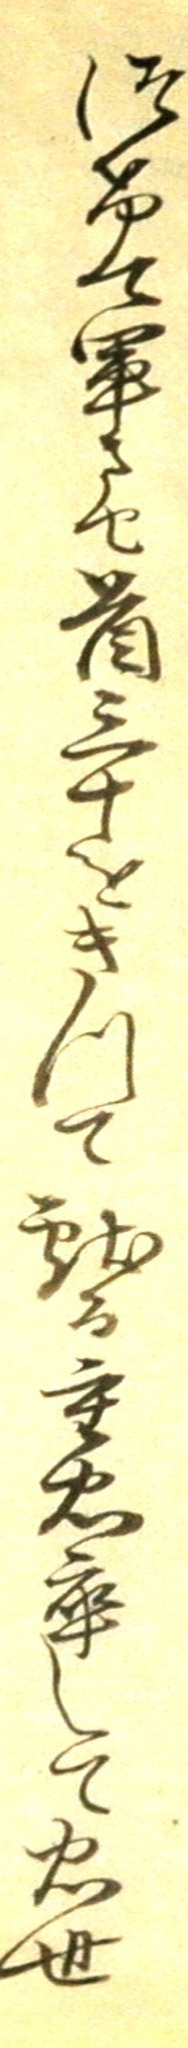つけて軍させ首三十をきつて献る重忠卒して忠世
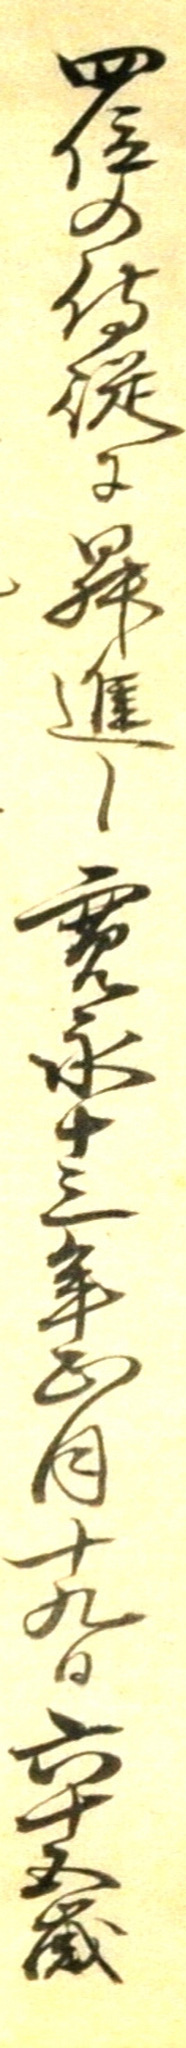四位の侍従に昇進し寛永十三年正月十九日六十五歳
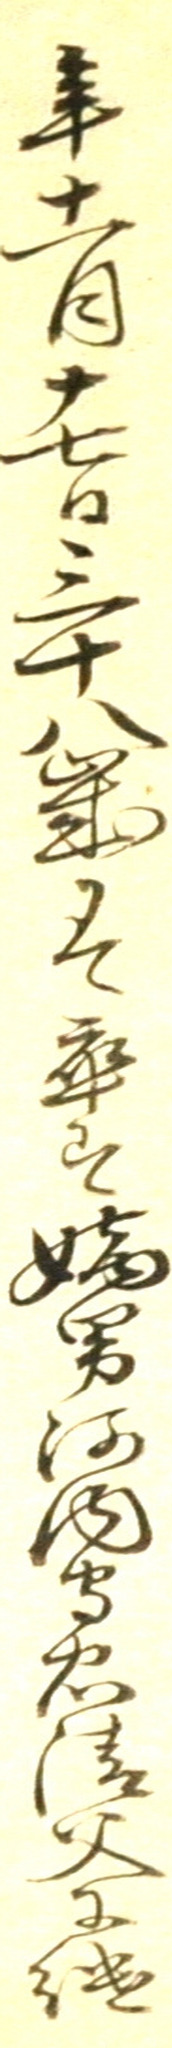年十一月十七日三十八歳にて卒す嫡男河内守忠清父に継
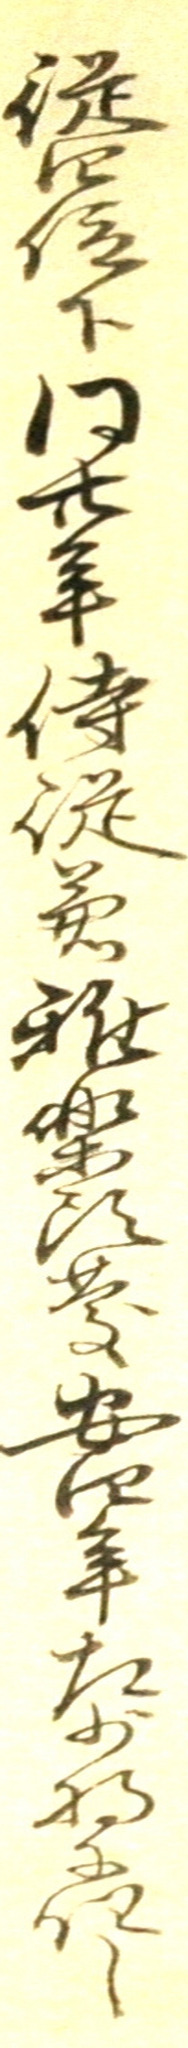従四位下同廿年侍従兼雅楽頭慶安四年左少将に任し
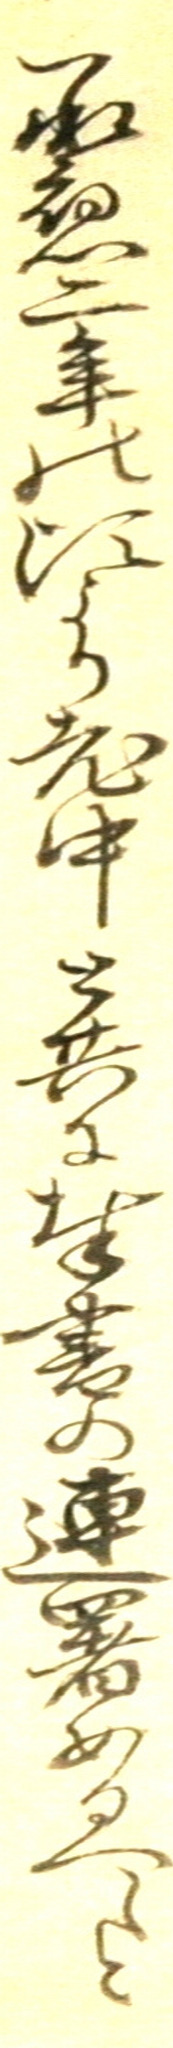承応二年の頃より老中と共に奉書の連署あるへしと
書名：藩翰譜（五）
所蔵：伊那市立高遠町図書館・合同会社AMANE
